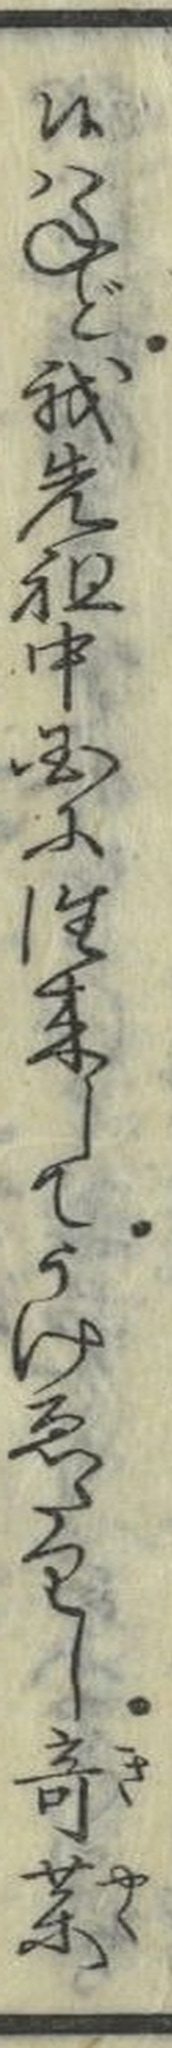候はねど・我先祖中国に往来して・うけゑたりし・竒薬
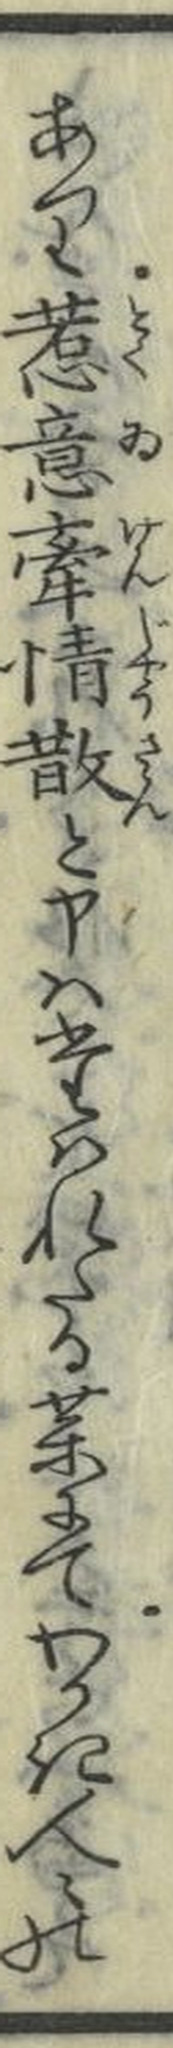あり・惹意牽情散と申はたはれたる薬にて・わかき人々の
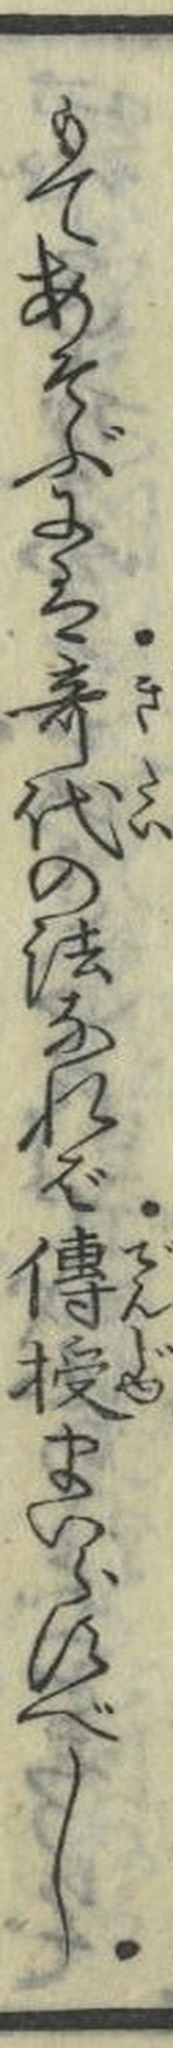もてあそぶには・竒代の法なれば・傳授まいらすべし・
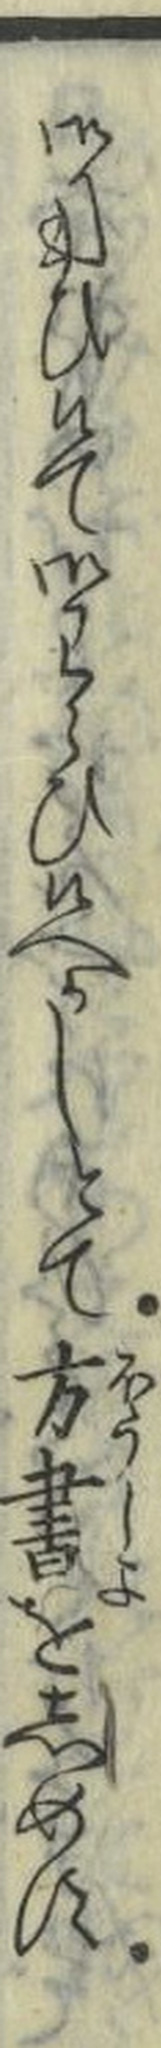御用ひ候て御わらひ候へかしとて・方書をしめす・
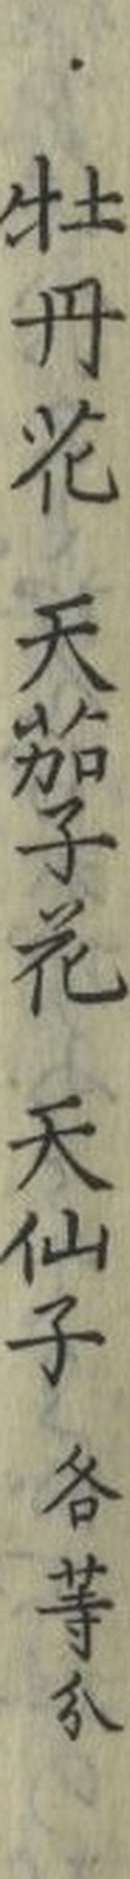牡丹花天茄子花天仙子各等分
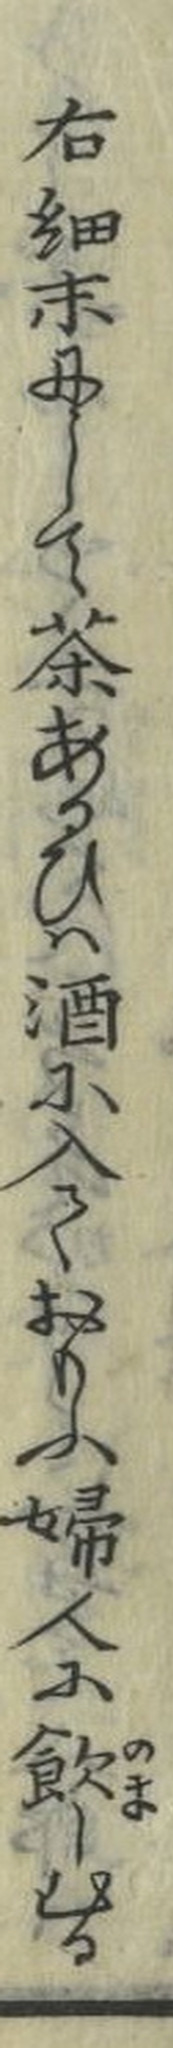右細末にして茶あるひは酒に入ておもふ婦人に飲しむる
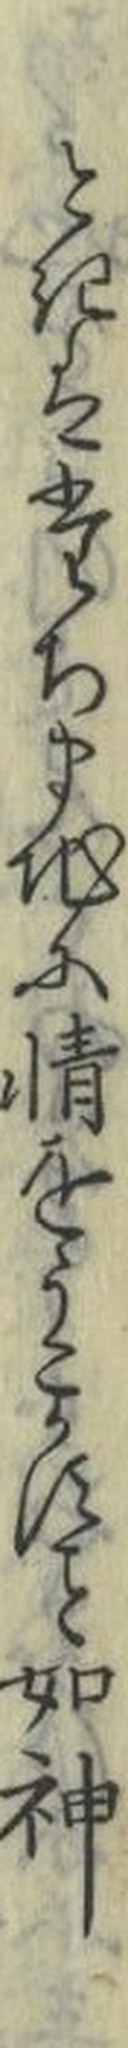ときはたちまちに情をうこかすと如神
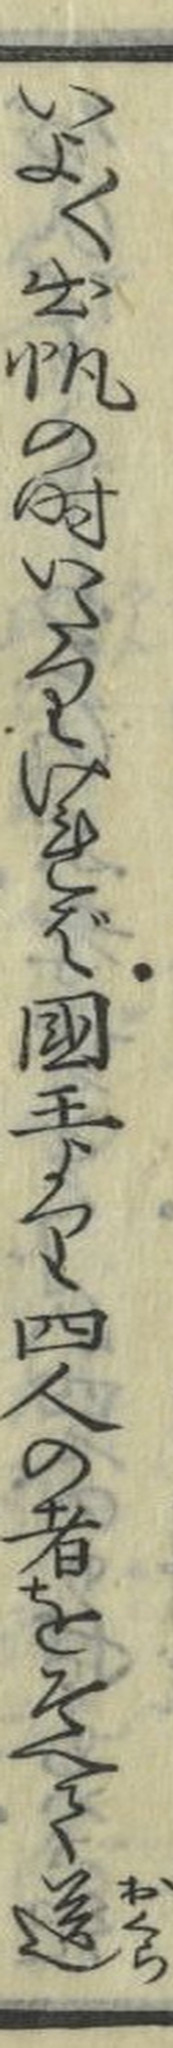いよ〳〵出帆の時いたりければ・國王より四人の者をそへて送
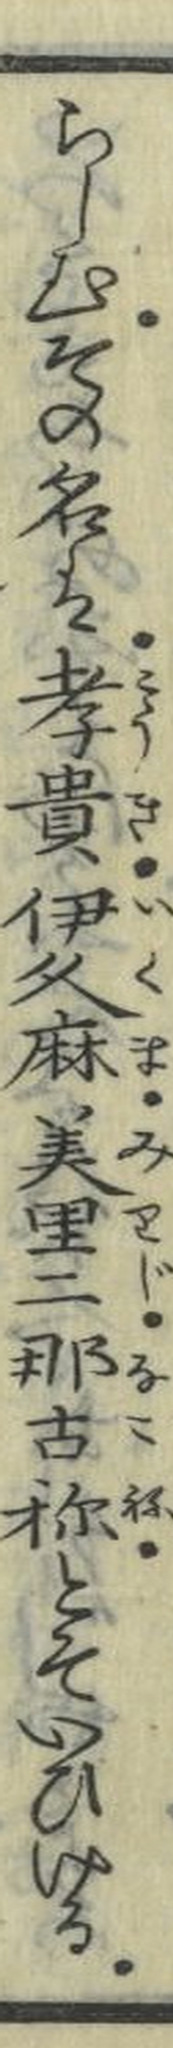らしむ・その名は・孝貴・伊久麻・美里二・那古祢・とそいひける・
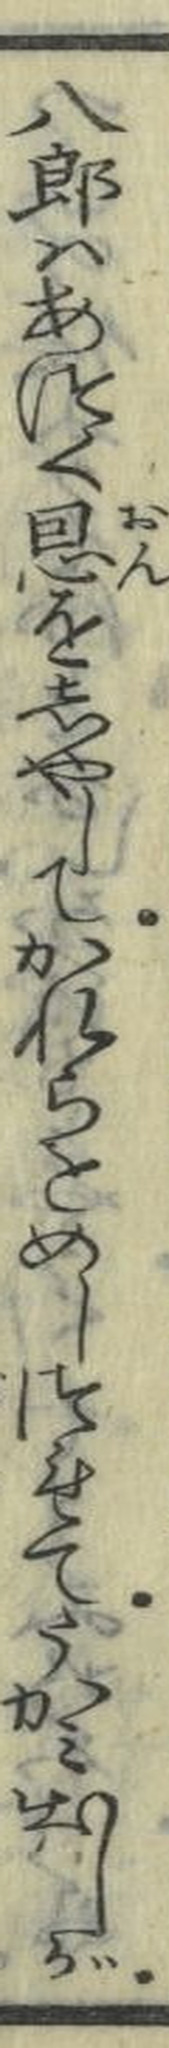八郎はあつく恩をしやして・かれらをめしつれて・うかみ出しが・
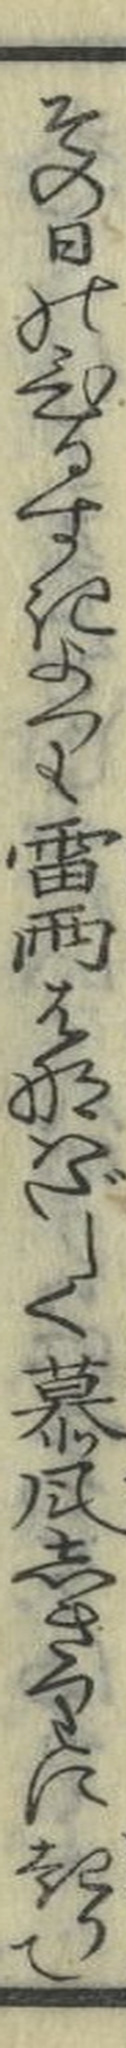その日のひるすきより・雷雨はなはだしく・慕風しきりに起りて・
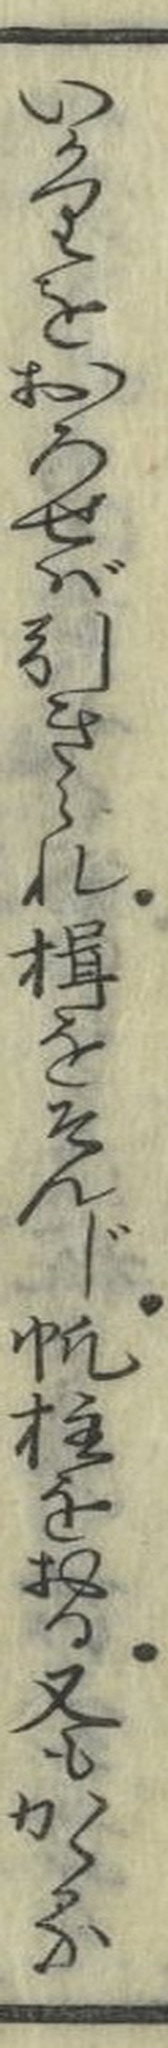いかりをおろせば引きられ・楫をそんじ・帆柱をおる・又もかゝる
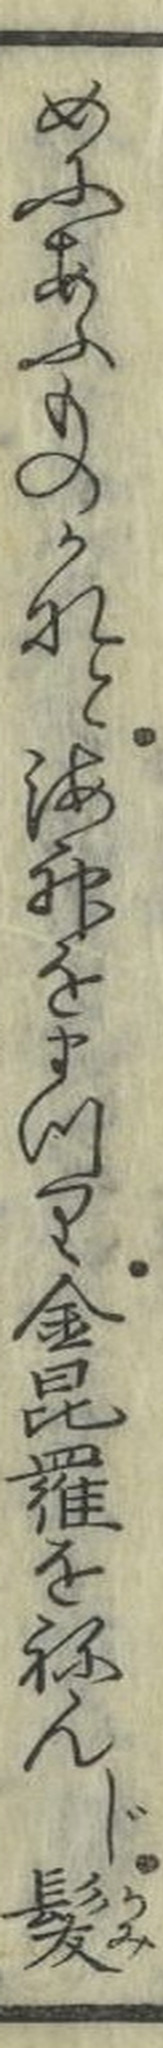めにあふものかなと・海神をまつり・金毘羅をねんじ・髪
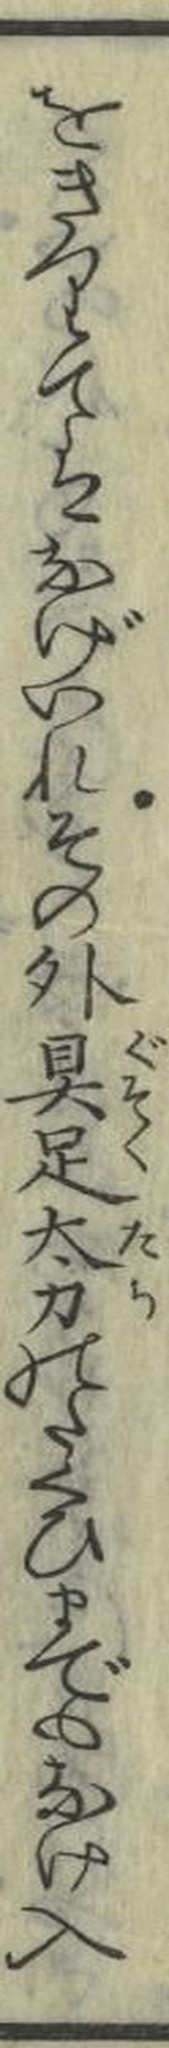をきりてはなげいれ・その外具足太刀のたくひまでもなけ入

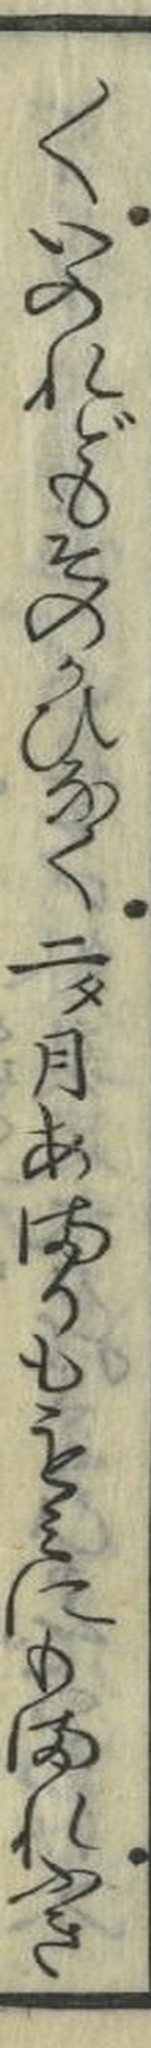〳〵・いのれどもそのかひなく・二タ月あまりももみにもまれ・ふき
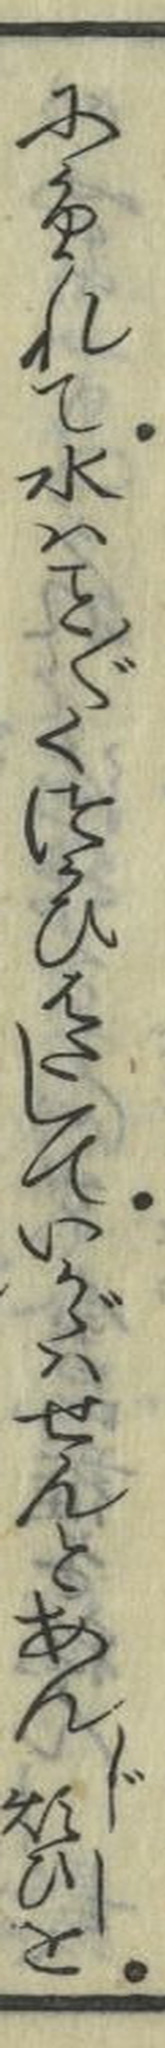にふかれて・水はこと〴〵くつかひはたして・いかがはせんとあんじ煩ひしを・
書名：琉球秊代記 附雑話 全
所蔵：University of the Ryukyus Library
